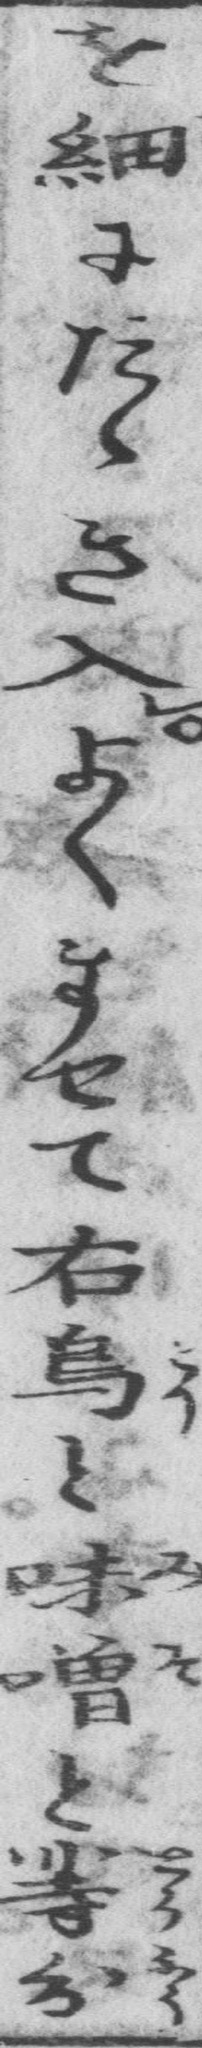を細にたゝき入れ。よくませて右鳥と味噌と等分
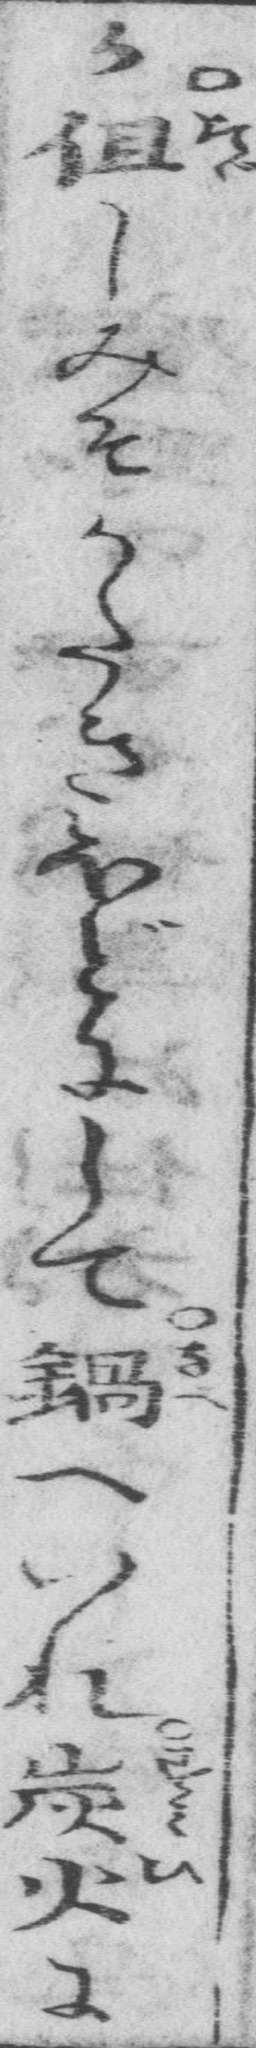か。但しみそかたきほどにして。鍋へいれ。炭火に
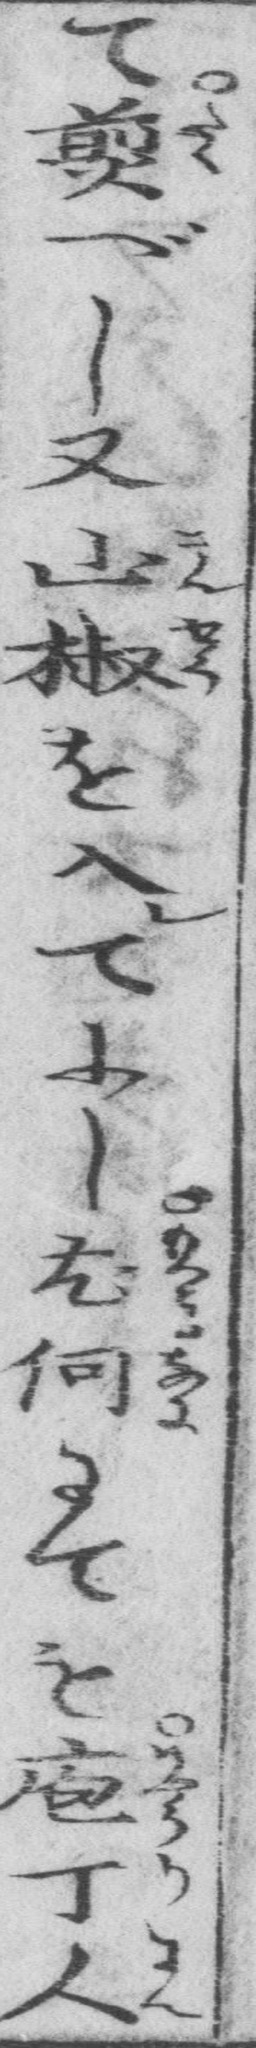て。煎べし又山椒を入れてよし。尤何にても。庖丁人
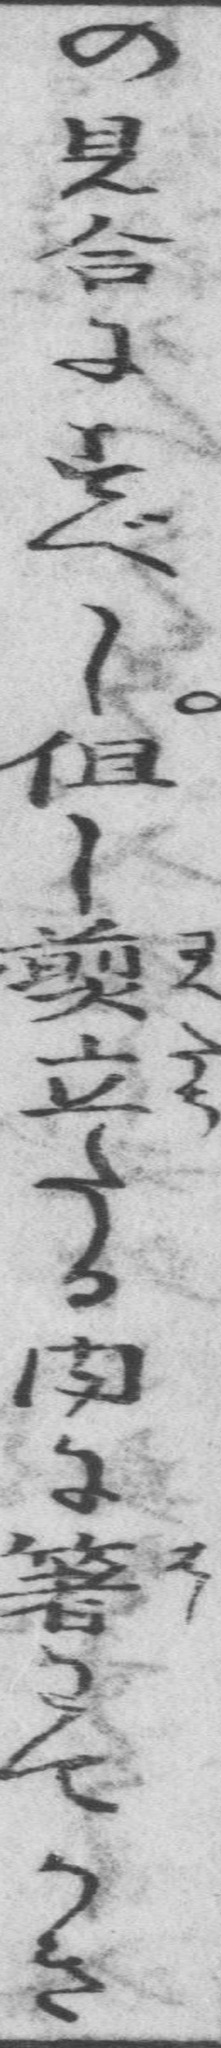の見合にすべし。但し煎立たる内に箸にてかき
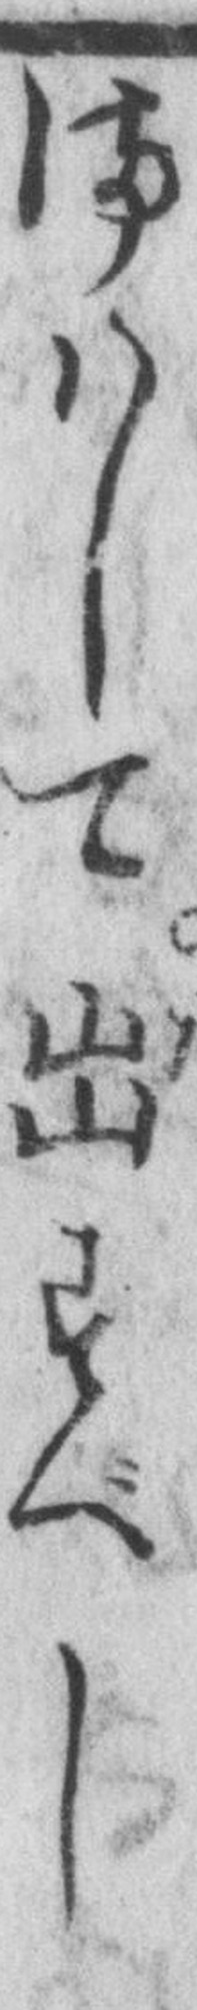まはして。出すべし
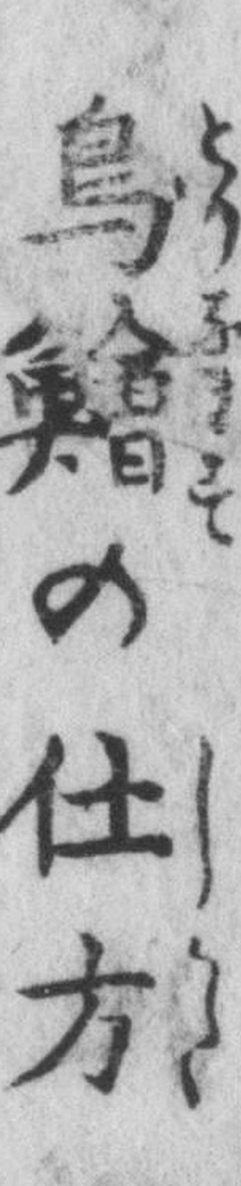鳥鱠の仕方
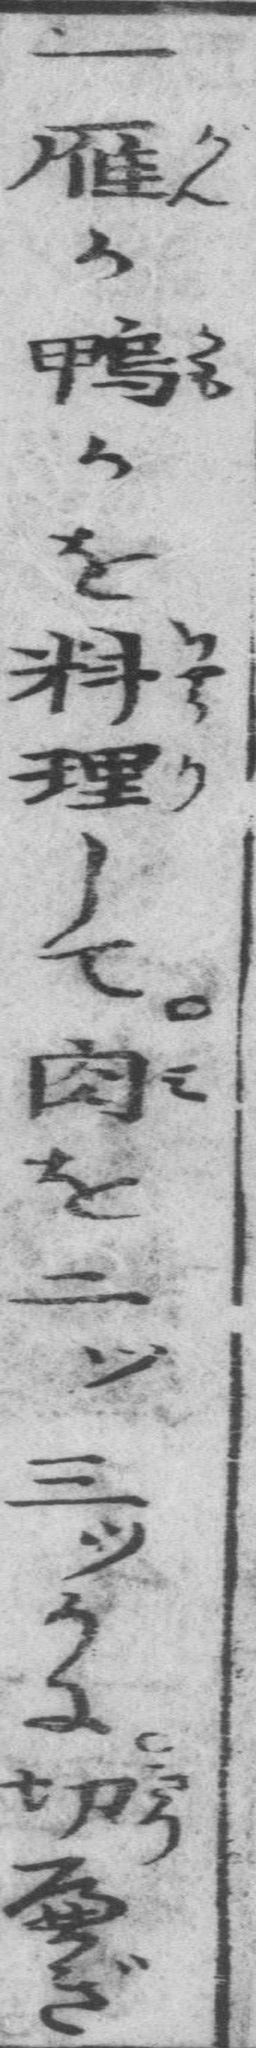一雁か鴨かを料理して。肉を二ツ三ツかに。切へぎ

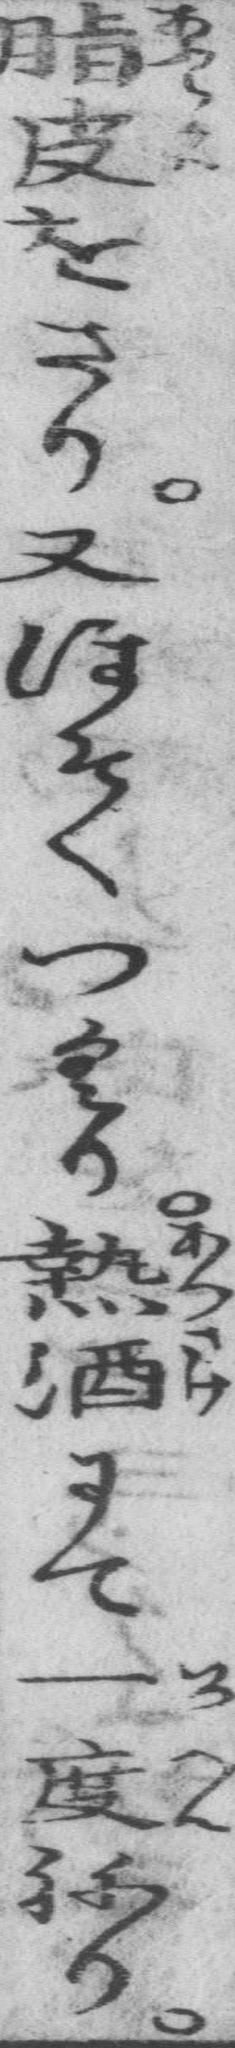脂皮をさり。又ほそくつくり。熱酒にて一度ねり。
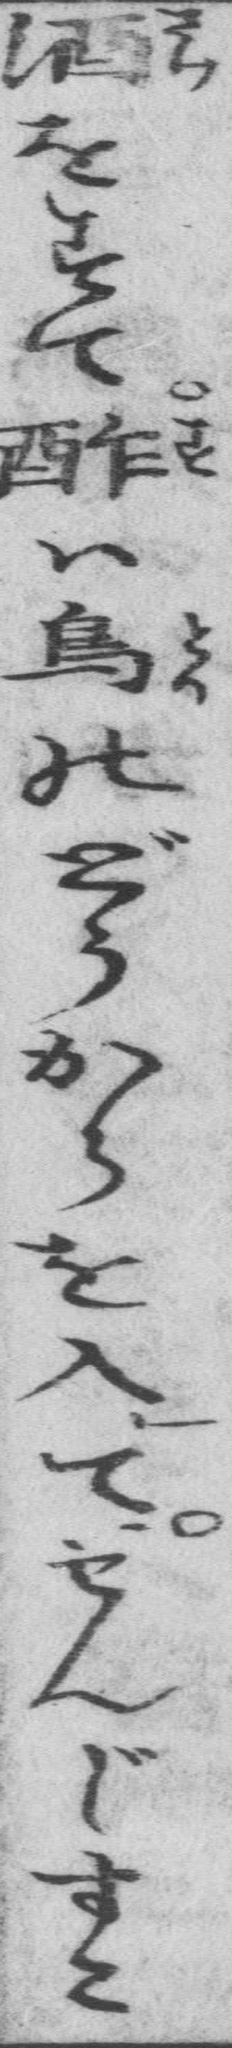酒をすて。酢は鳥のどうからを入れて。せんじすこ
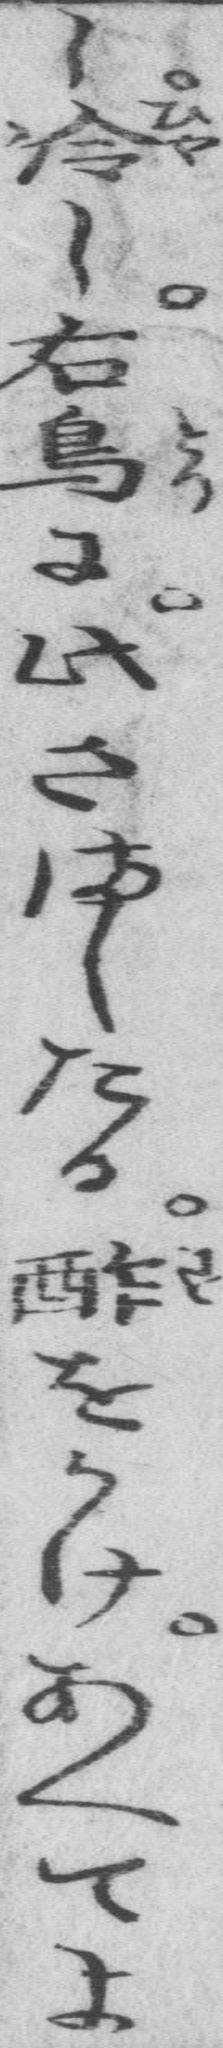し。冷し。右鳥に。此さましたる。酢をかけ。あへてよ
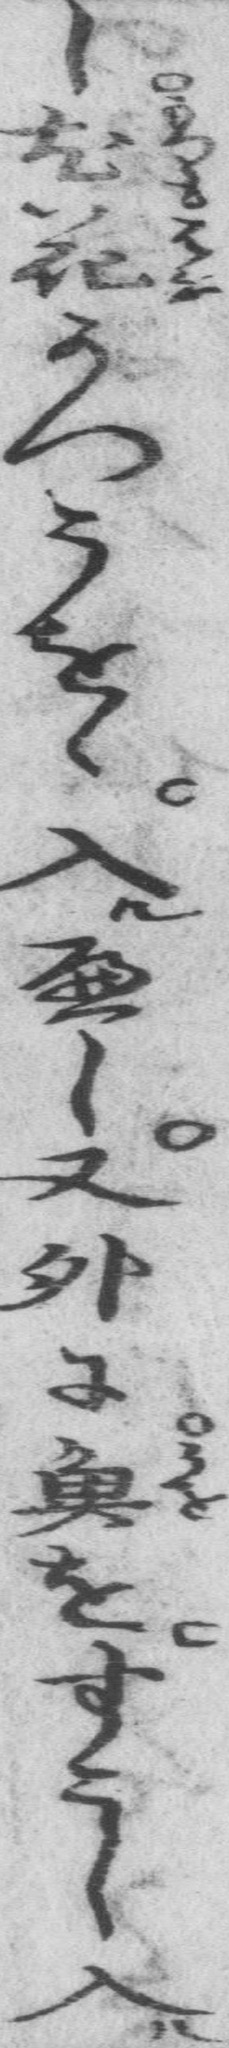し。尤花かつうをゝ。入るへし。又外に。魚を。すこし入る
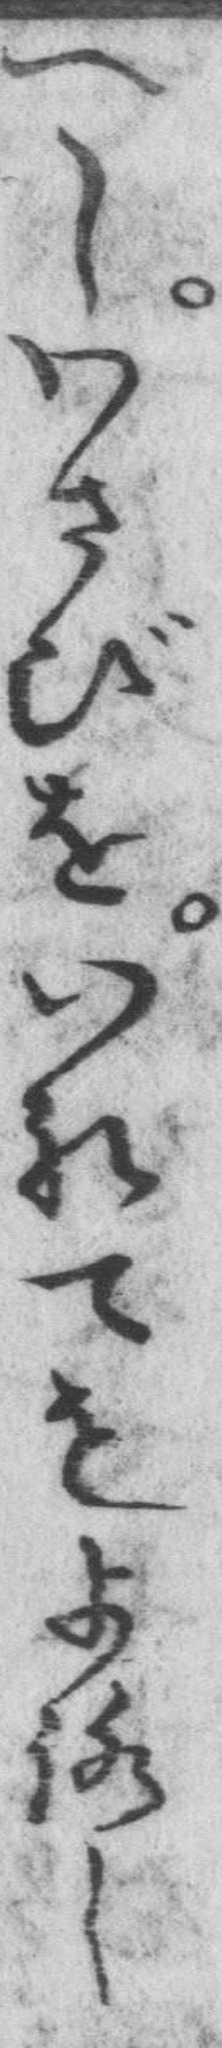へし。わさびを。いれてもよろし
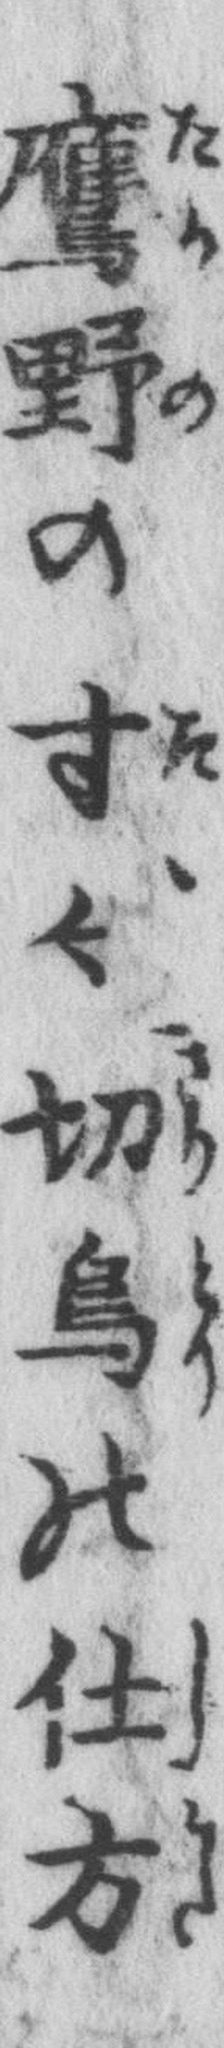鷹野の寸々切鳥の仕方
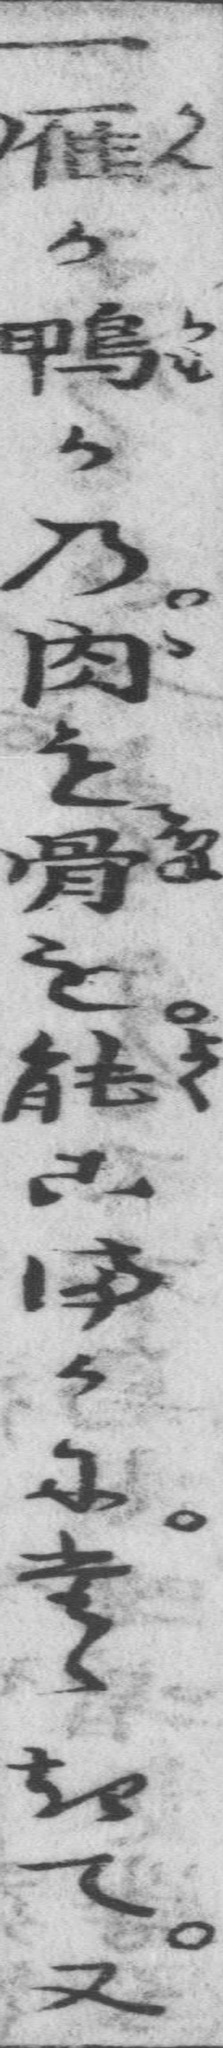一雁か鴨かの。肉も骨も。能こまかに。たゝきて。又
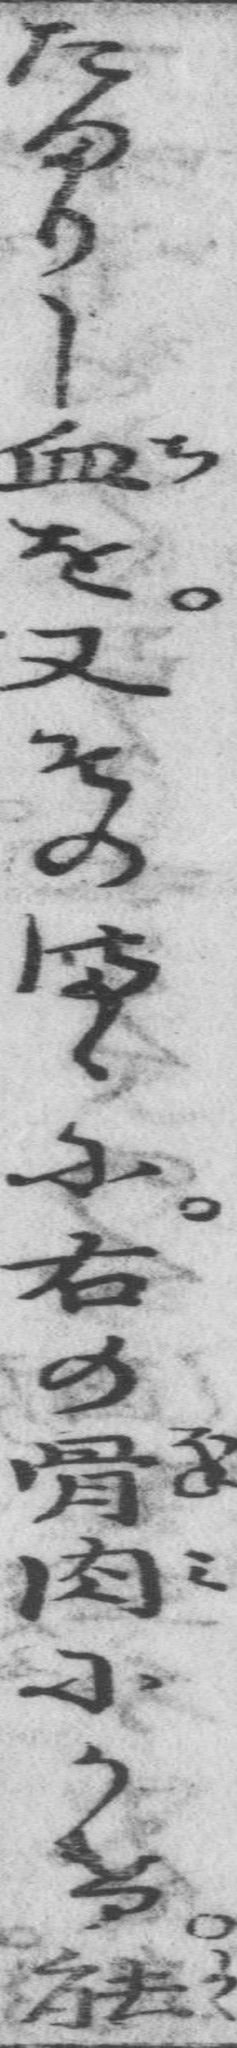たまりし血を。又そのまゝに。右の骨肉にかけ。能
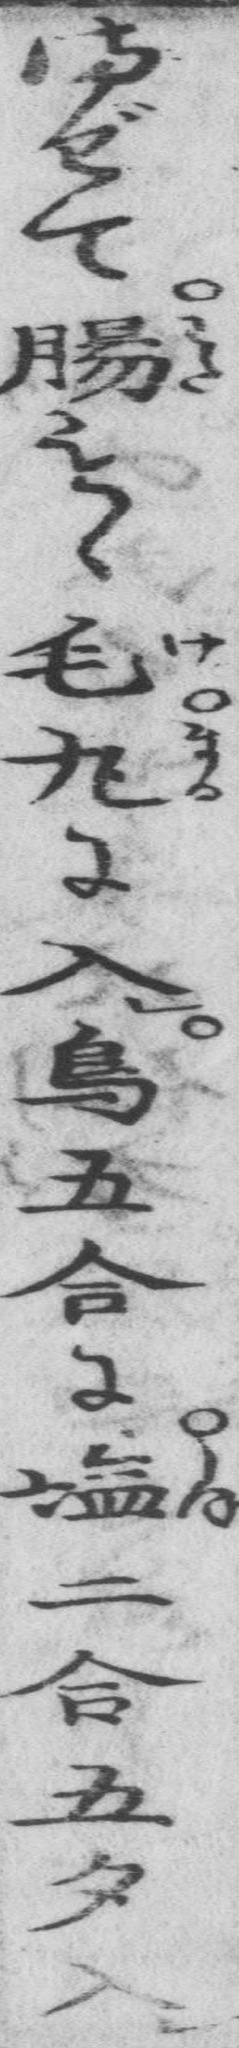まぜて。腸もも毛。丸に入れ。鳥五合に。塩二合五勺入れ
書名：萬寳料理秘密箱
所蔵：大阪府立大学学術情報センター 国文学研究資料館
